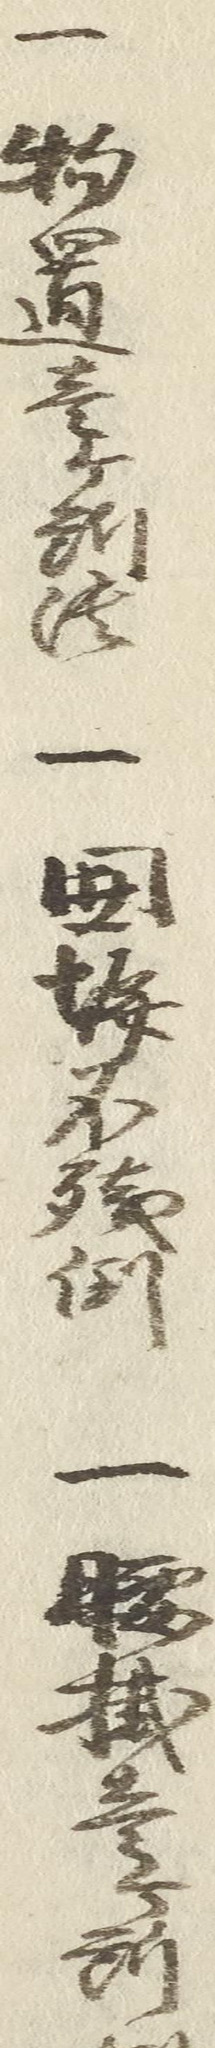一物置壱ヶ所潰一囲塀不残倒一腰掛壱ヶ所倒
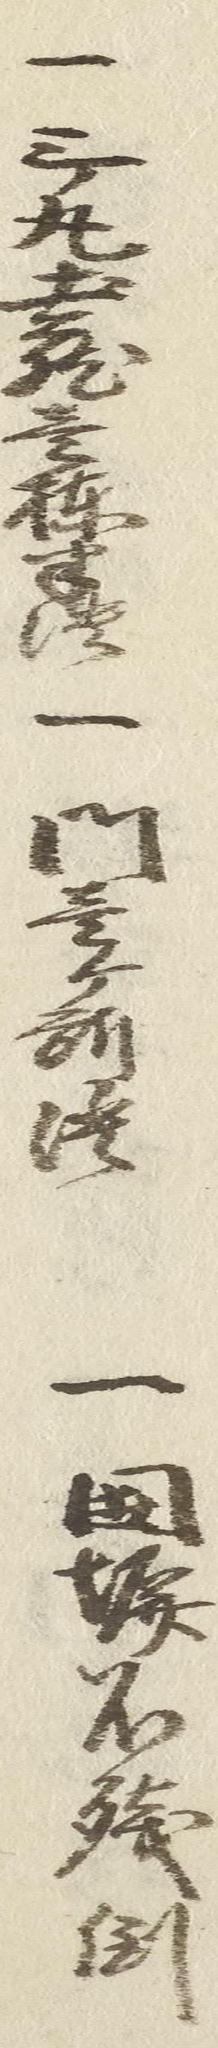一三ノ丸土蔵壱棟半潰一門壱ヶ所潰一囲塀不残倒
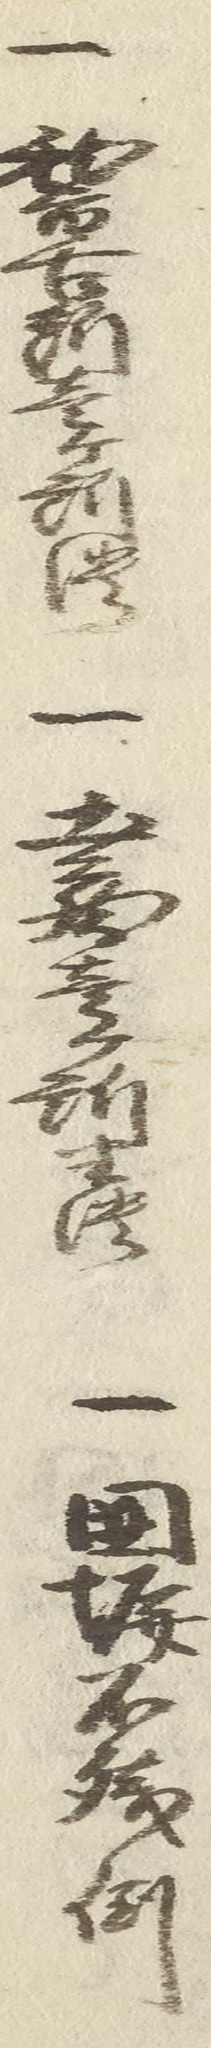一稽古所壱ヶ所潰一土蔵壱ヶ所半潰一囲塀不残潰
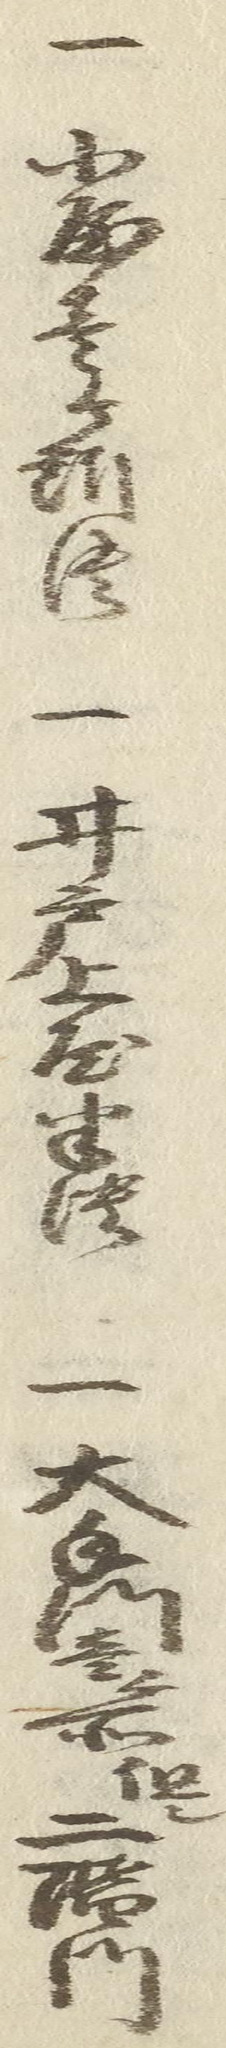一小屋壱ヶ所潰一井戸上屋半潰一大手門壱ヶ所但し二階門

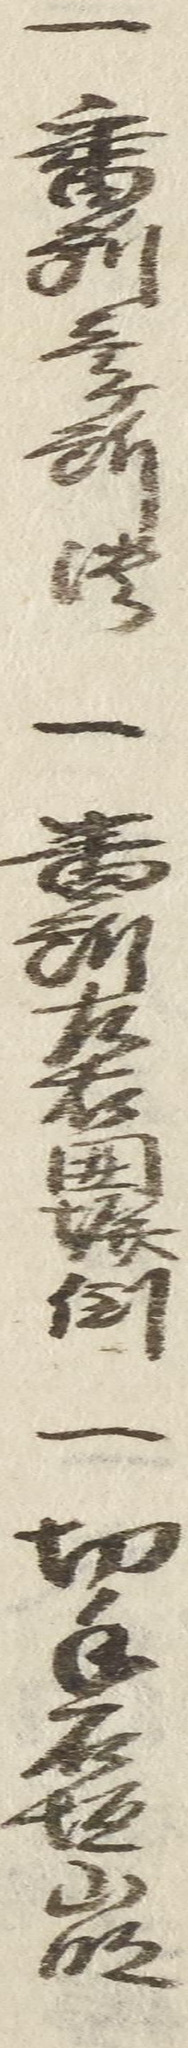一番所壱ヶ所潰一番所左右囲塀倒れ一切手石垣崩
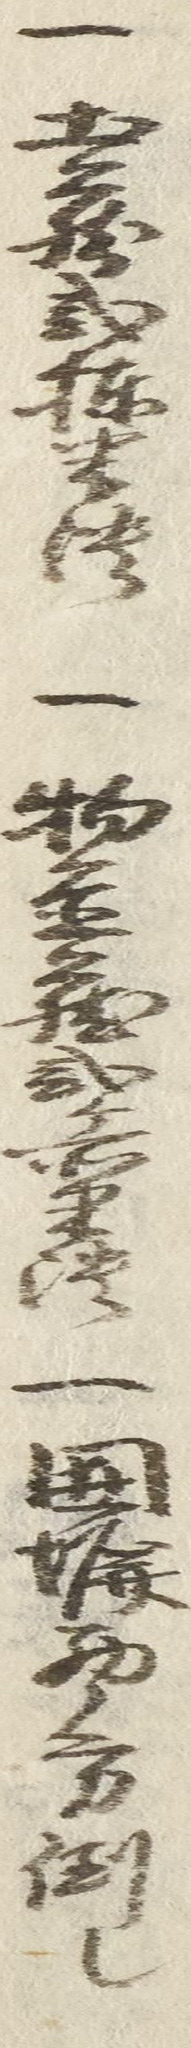一土蔵二棟半潰一物置蔵弐ヶ所半潰一囲塀西ノ方倒
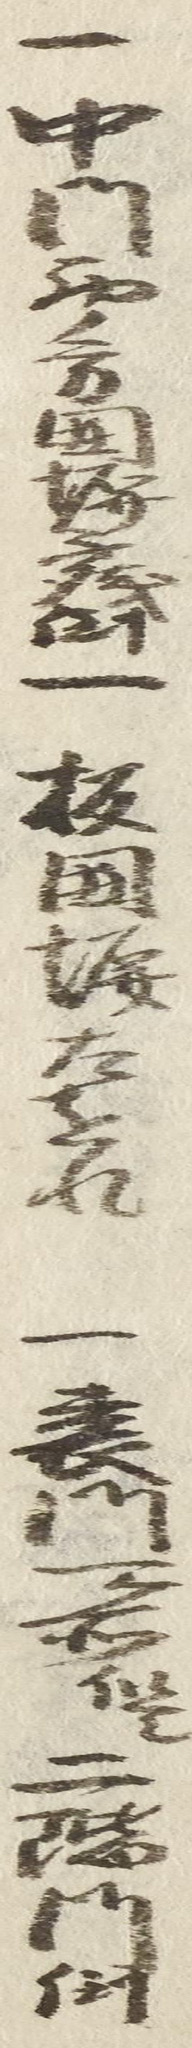一中門西ノ方囲塀不残倒一板囲塀たをれ一表門一ヶ所但し二階門倒
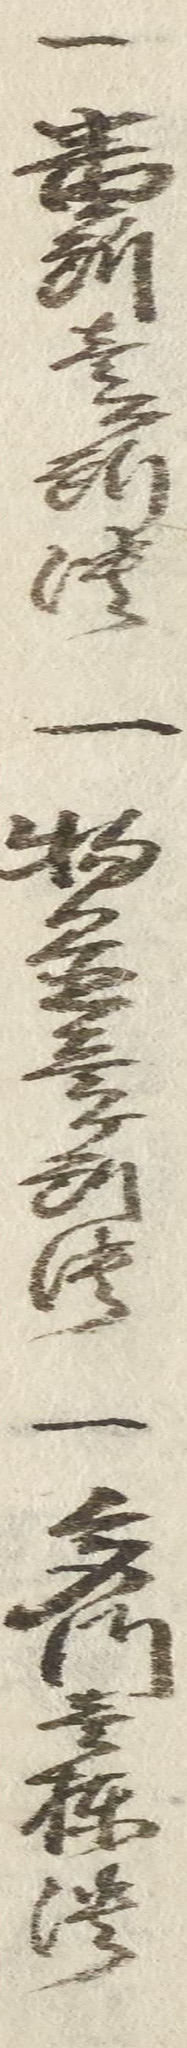一番所壱ヶ所潰一物置壱ヶ所潰一多門壱棟潰
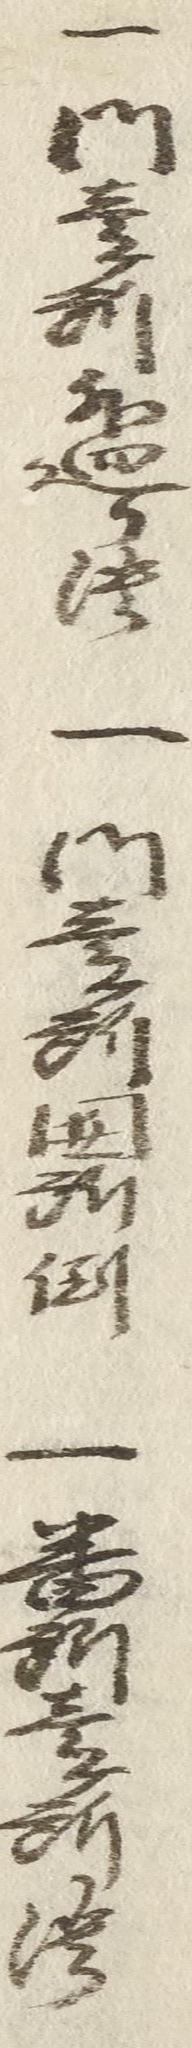一門壱ヶ所外廻り潰一門壱メ諸囲所倒一番所壱ヶ所潰
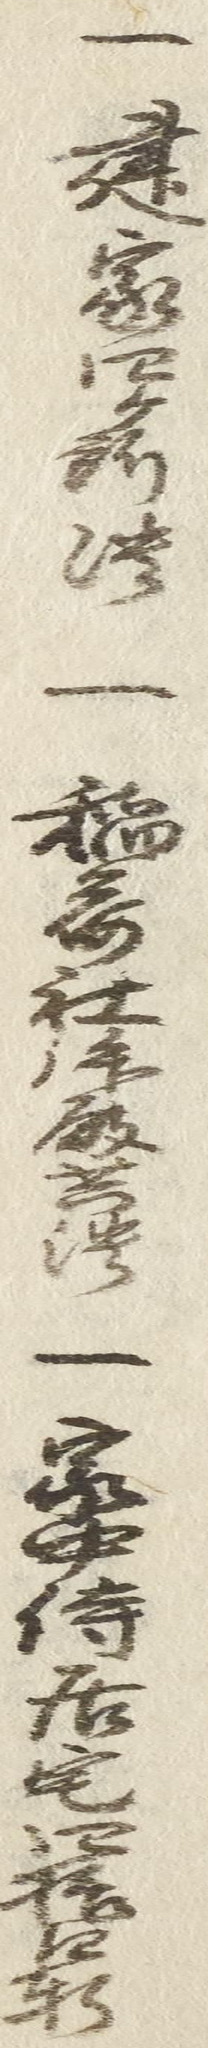一建家四ヶ所潰一稲荷社拝殿共潰一家中侍居宅四拾四軒
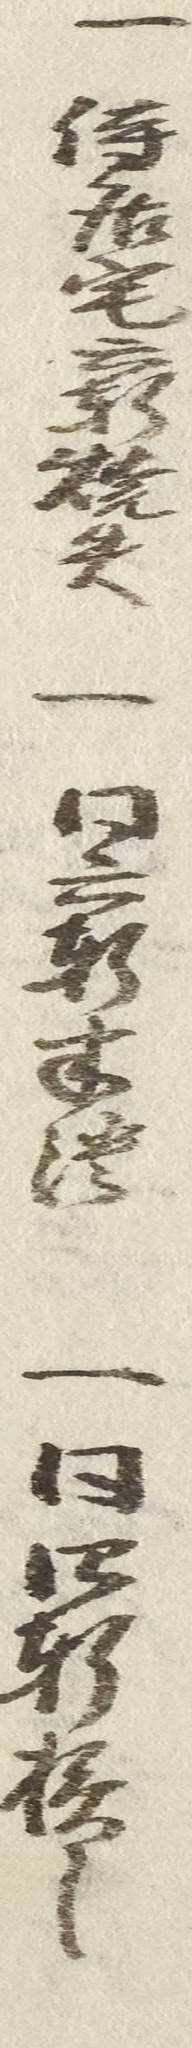一侍居宅六軒焼失一同六軒半潰一同四軒損し
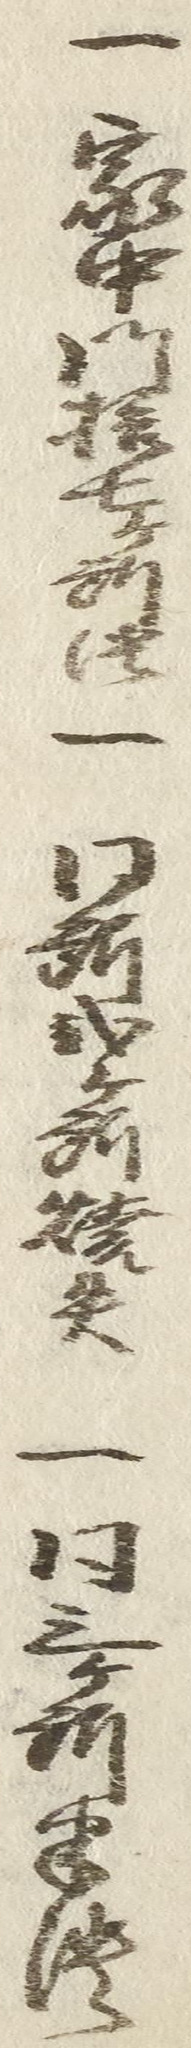一家中門損七ヶ所潰一同所弐ヶ所焼失一同三ヶ所半潰
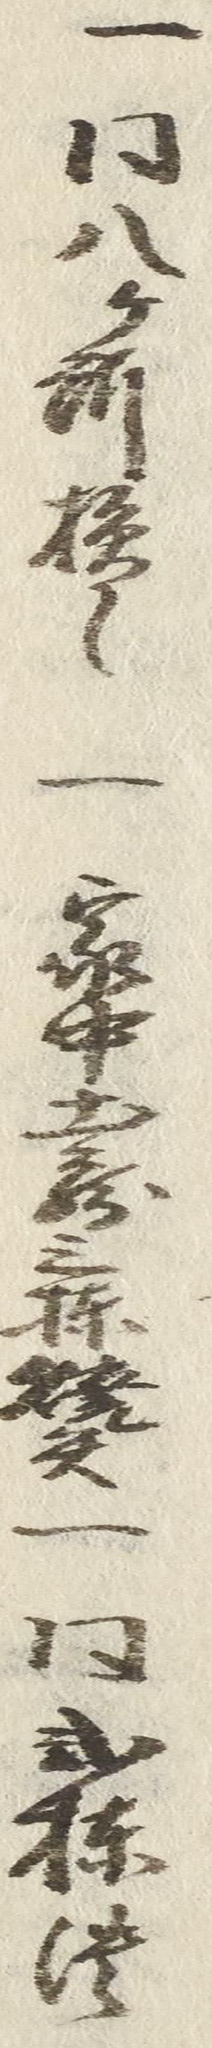一同八ヶ所損し一家中土蔵三棟焼失一同弐棟潰
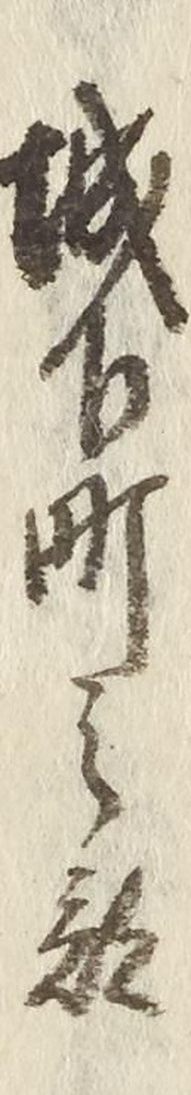城下町之分

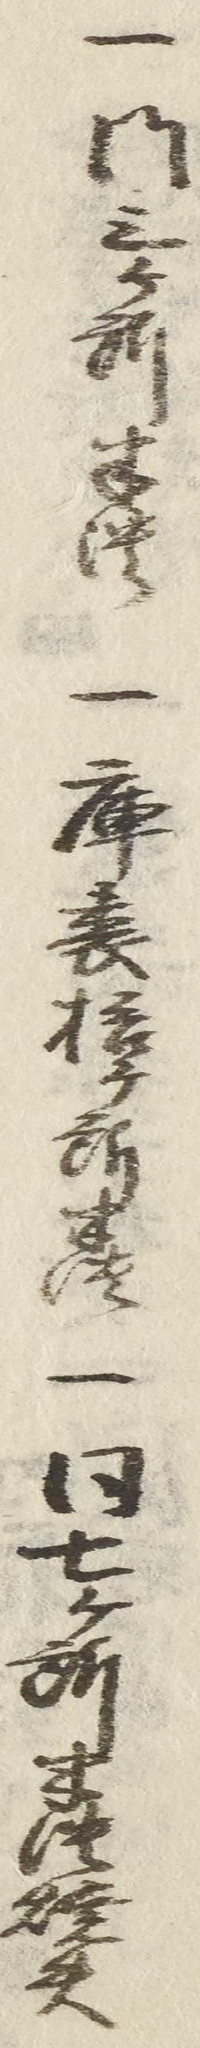一門三ヶ所半潰一庫表拾ヶ所半潰一同七ヶ所半潰焼失
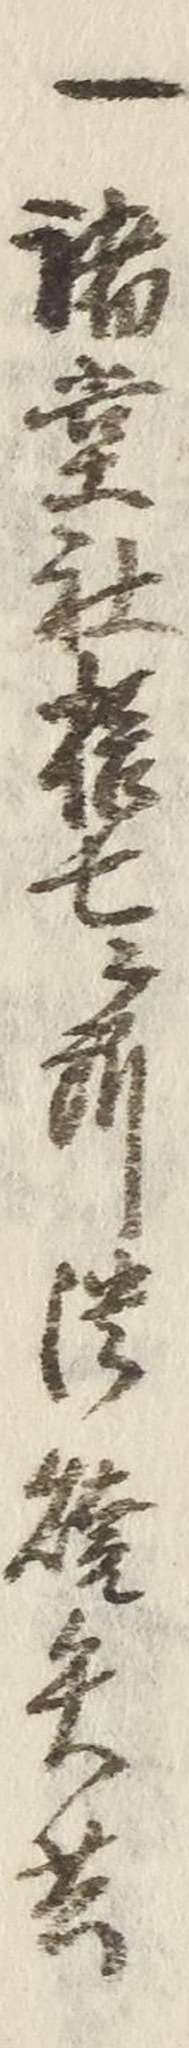一諸堂社拾七ヶ所潰焼失共
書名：従往古地震御届書記誌之一
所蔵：東京大学地震研究所図書室 Earthquake Research Institute Library, The University of Tokyo, JAPAN
